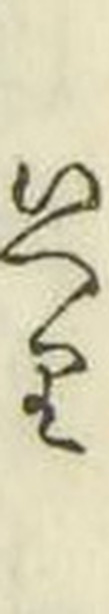いへり
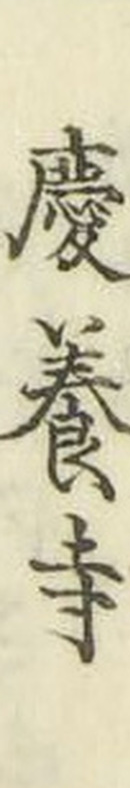慶養寺
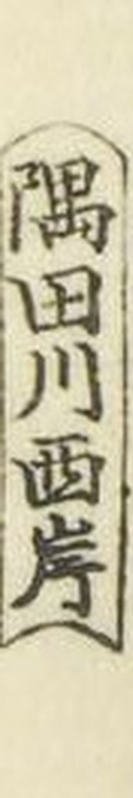隅田川西岸
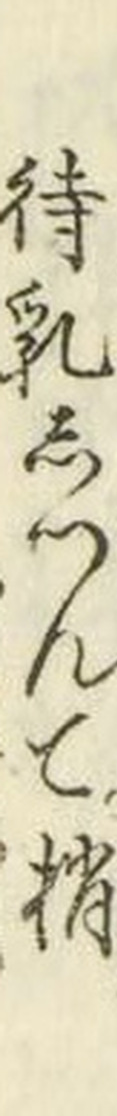待乳しつんて。梢
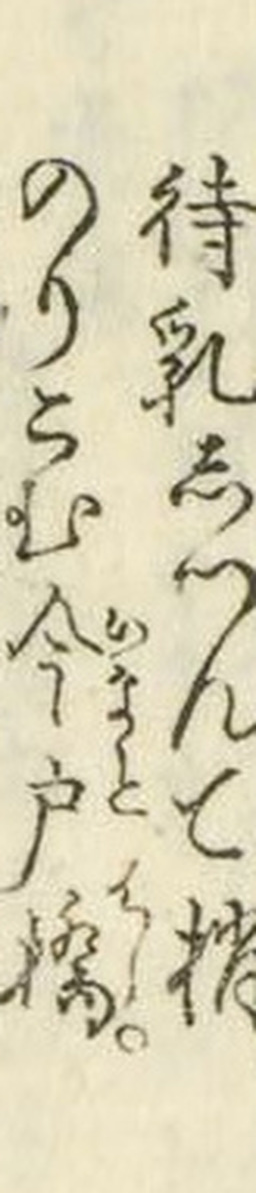のりこむ今戸橋。
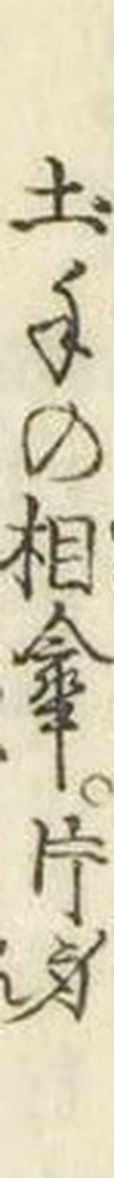土手の相傘。片身
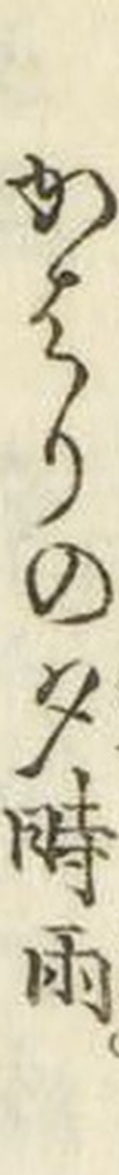かはりの夕時雨。
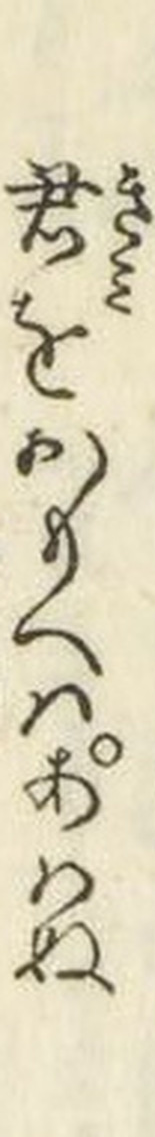君をおもへは。あはぬ
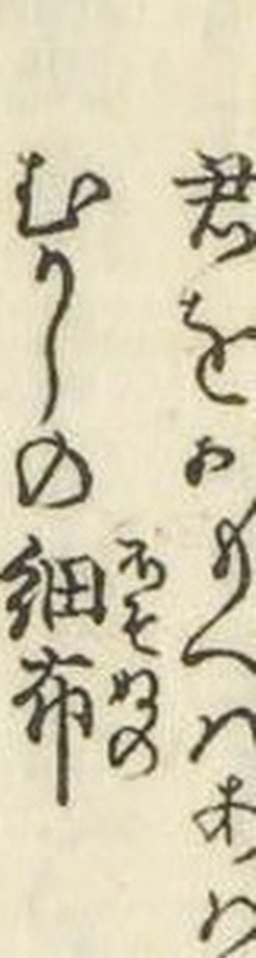むかしの細布
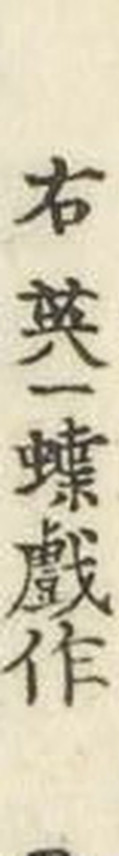右英一蝶戯作
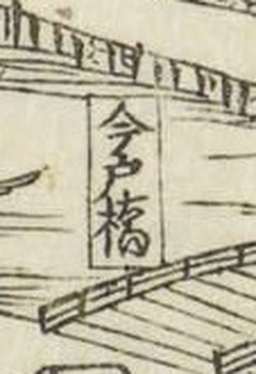今戸橋

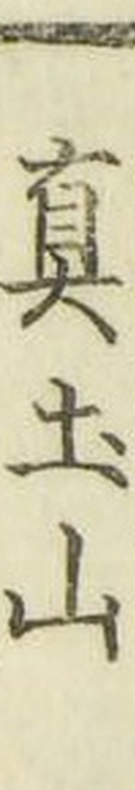真土山
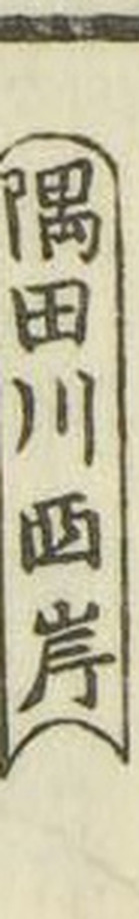隅田川西岸
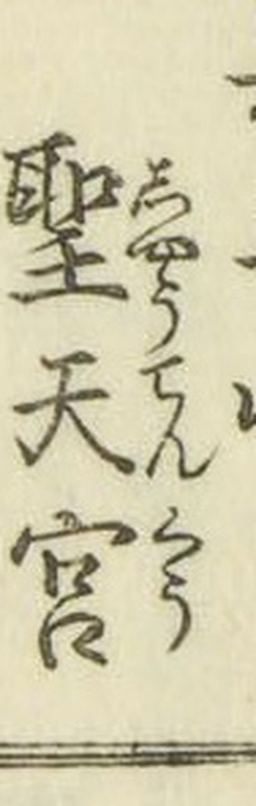聖天宮
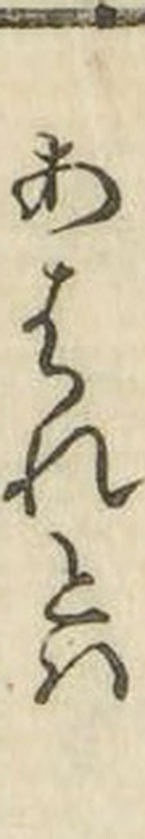あはれとは
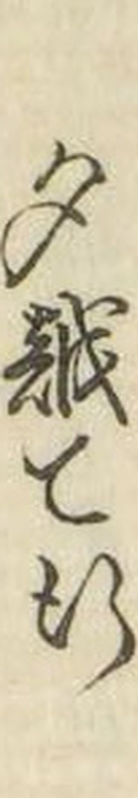夕越て行
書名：江戸名所図会 20巻 巻之17
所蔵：東京学芸大学教育コンテンツアーカイブ
